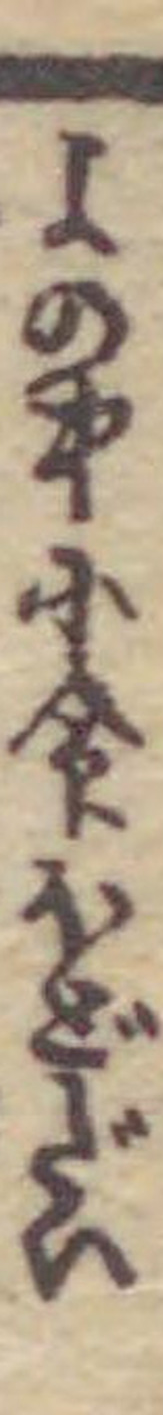よの中に命ほどだい
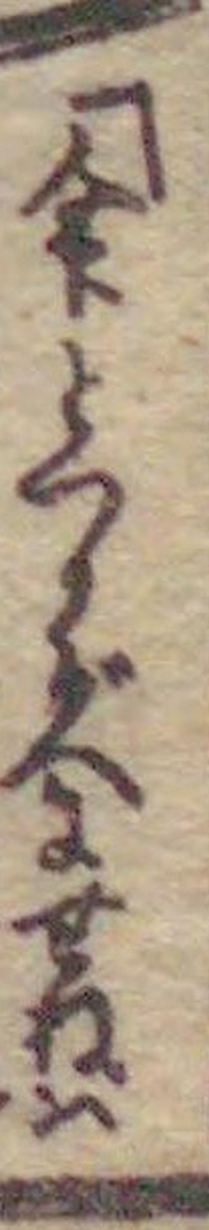〽命とつりがへにせねは
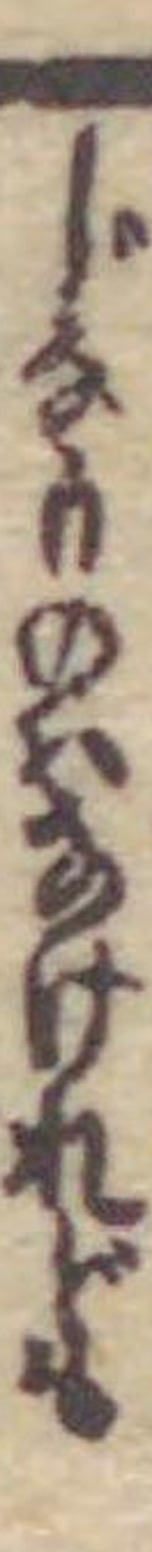じなものはなけれども
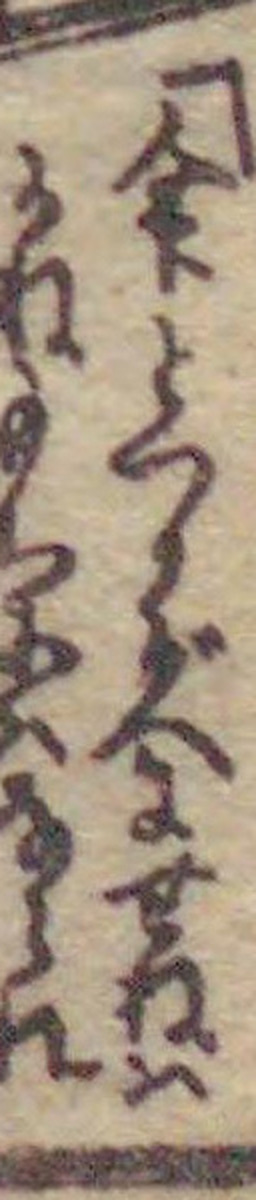かねもちにはなられ
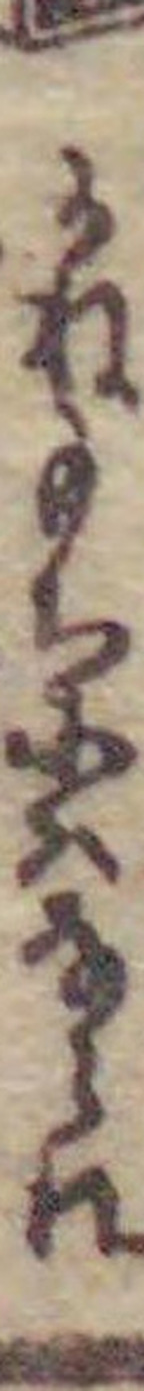かねもちにはなられ
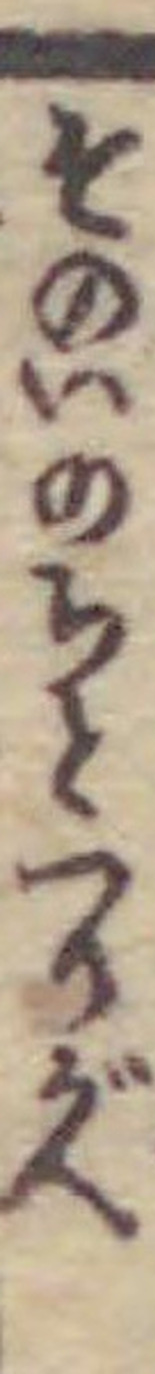そのいのちとつりがへ
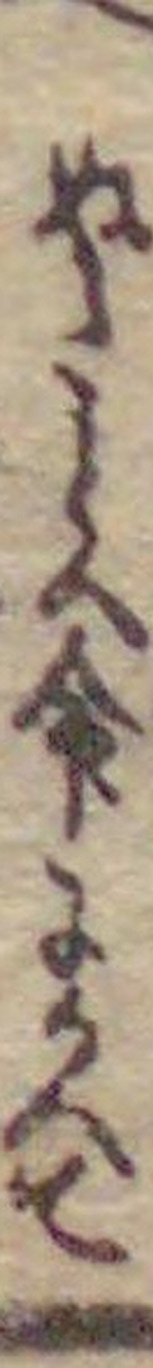ぬたとへ命にかへて
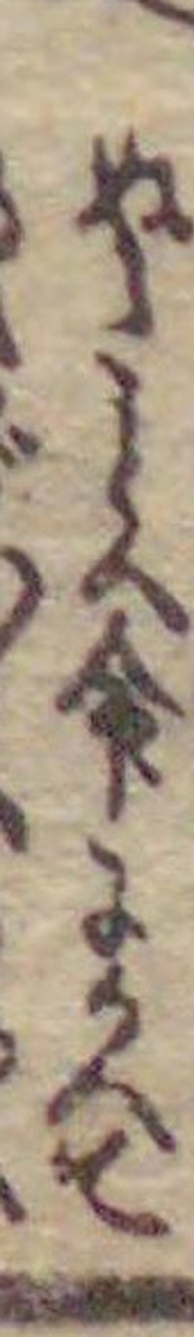ぬたとへ命にかへて
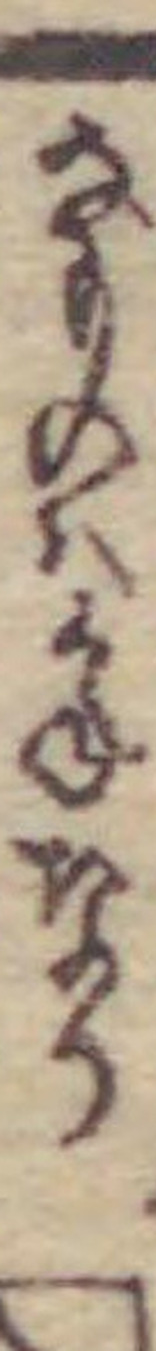なものはかねなり
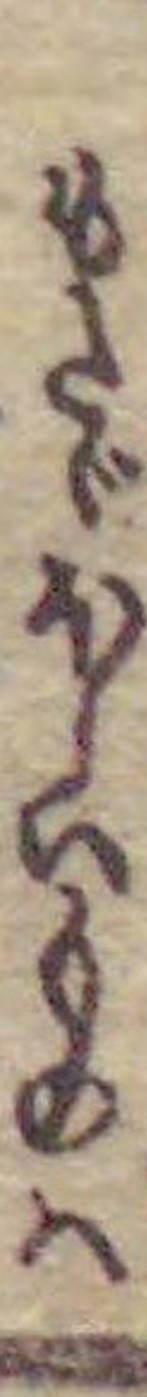もたゞほしいものは
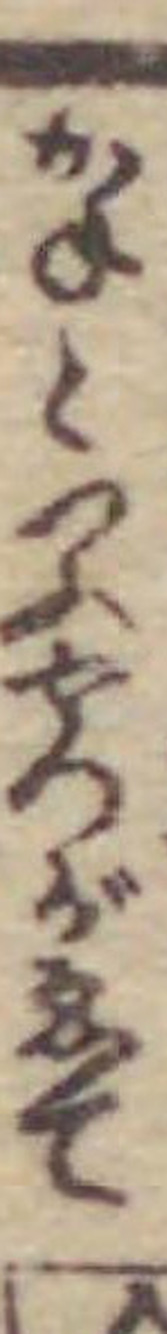かねとつふやつがゑて
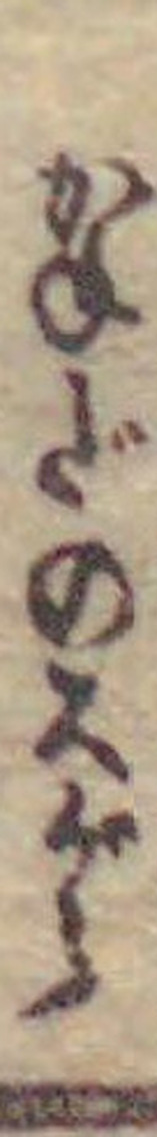かねだのはがふ
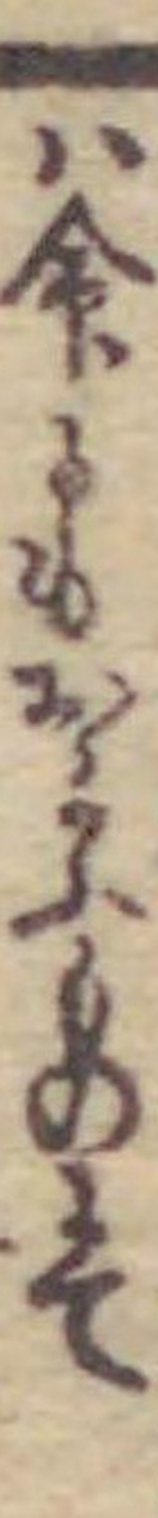は命にもおよふものにて
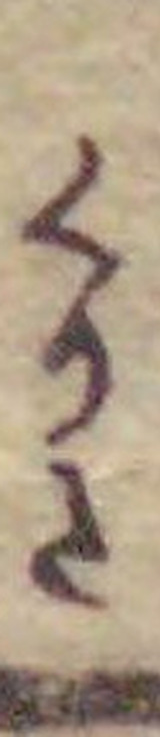くりた
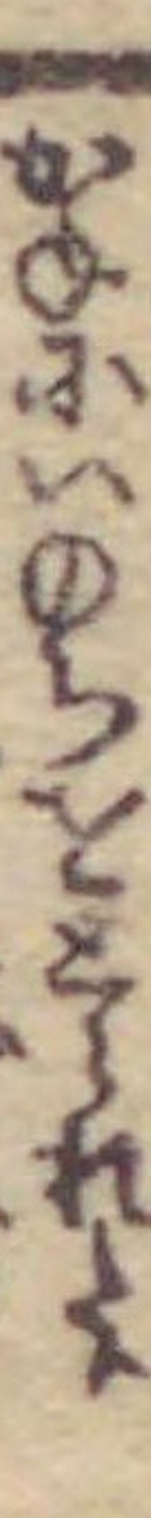かねにいのちをとられた
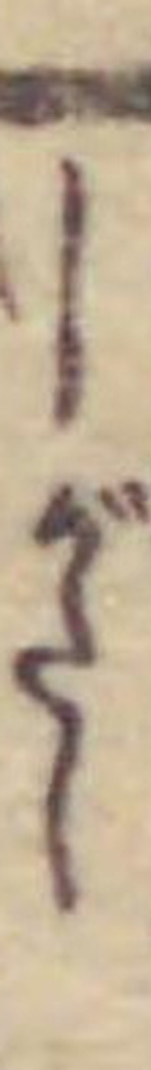しがたし
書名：御誂染長寿小紋 : 3巻
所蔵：国立国会図書館 National Diet Library, JAPAN
